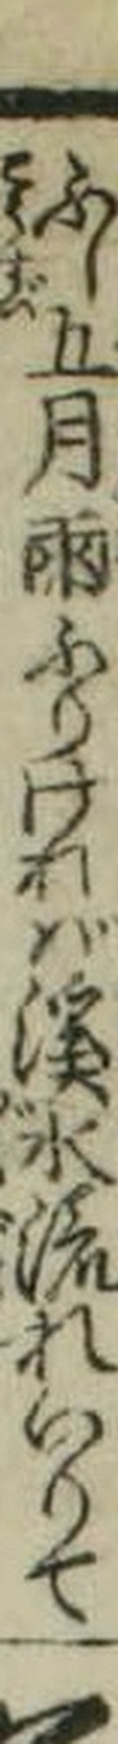ふし五月雨ふりければ渓水流れいりて
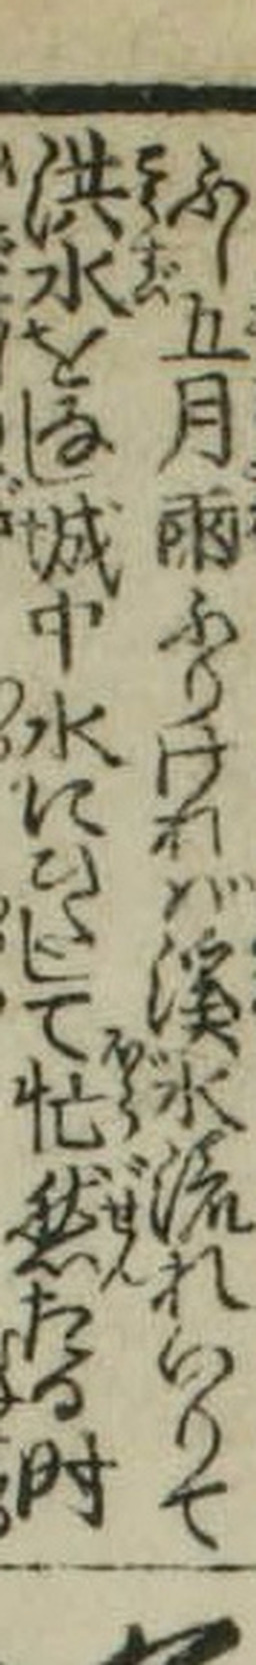洪水をなし城中水にひたして忙然たる時
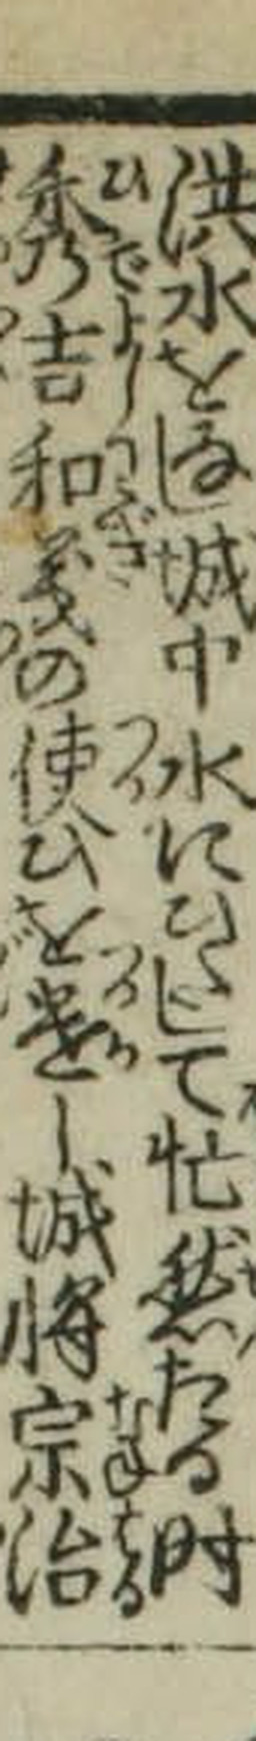秀吉和義の使ひを遣し城将宗治
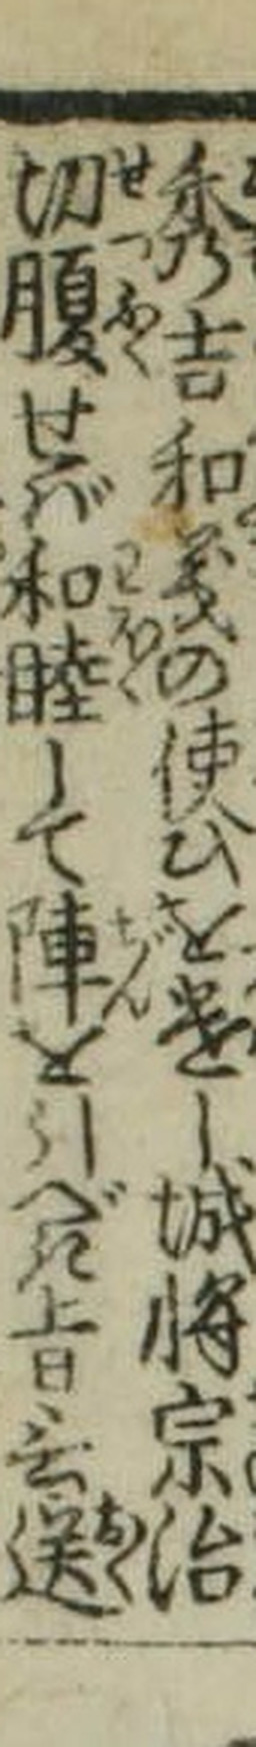切腹せば和睦して陣を引べき旨言送
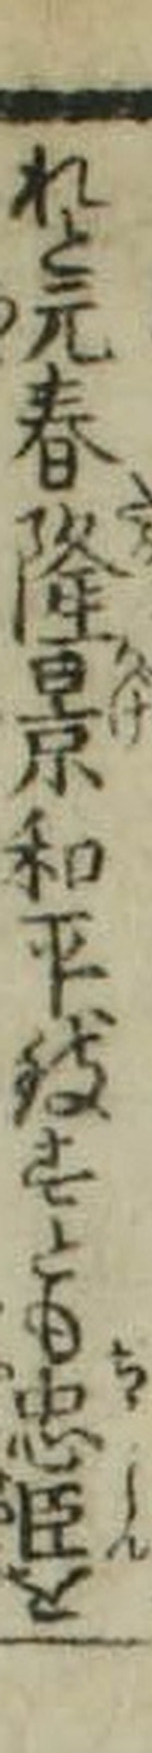れと元春隆景和平致すとも忠臣を
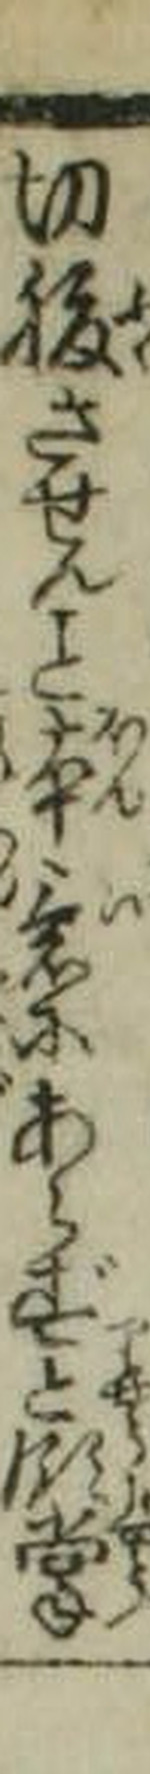切腹させんこと本位にあらずと領掌
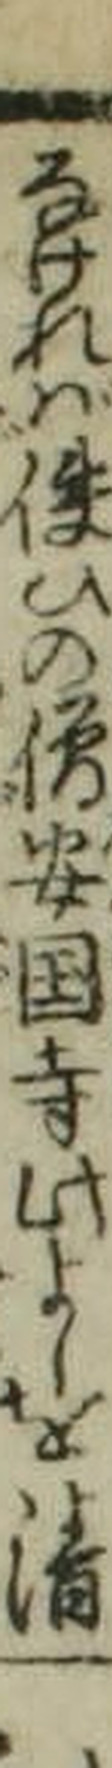なければ使ひの僧安国寺此よしを清
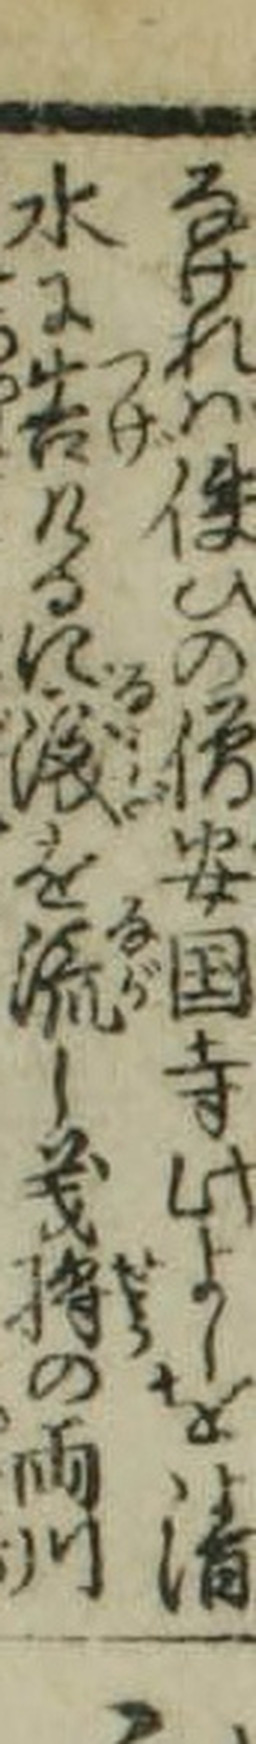水に告けるに涙を流し義将の両川
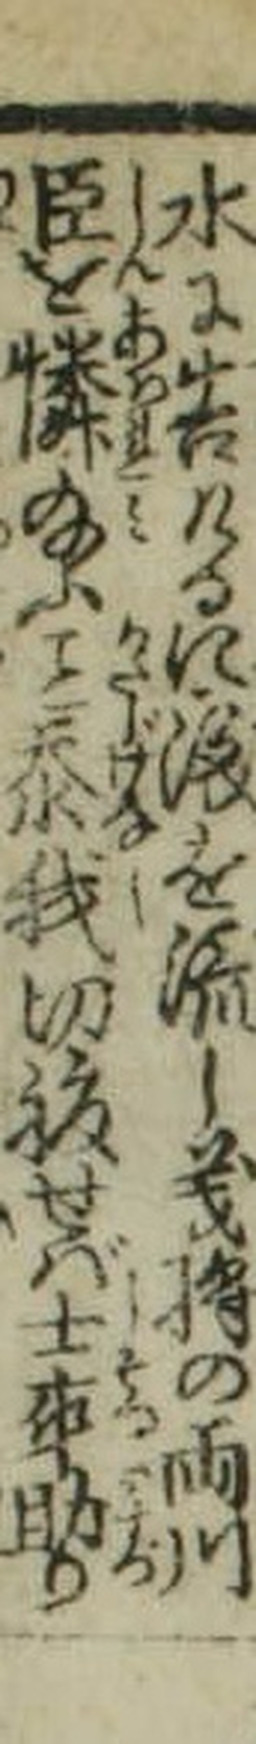臣を憐給ふこと忝切腹せば士卒助り
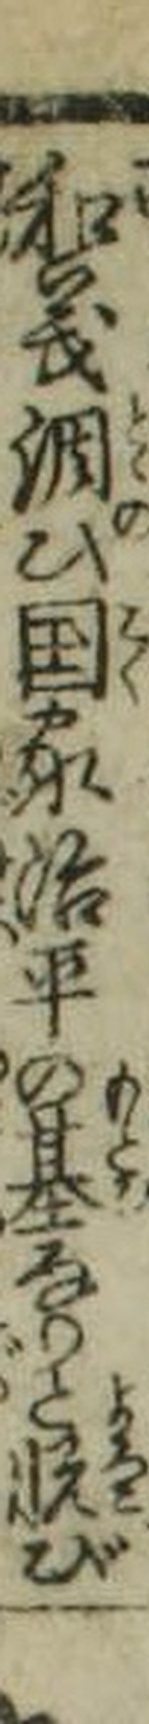和義調ひ国家治平の基なりと悦び
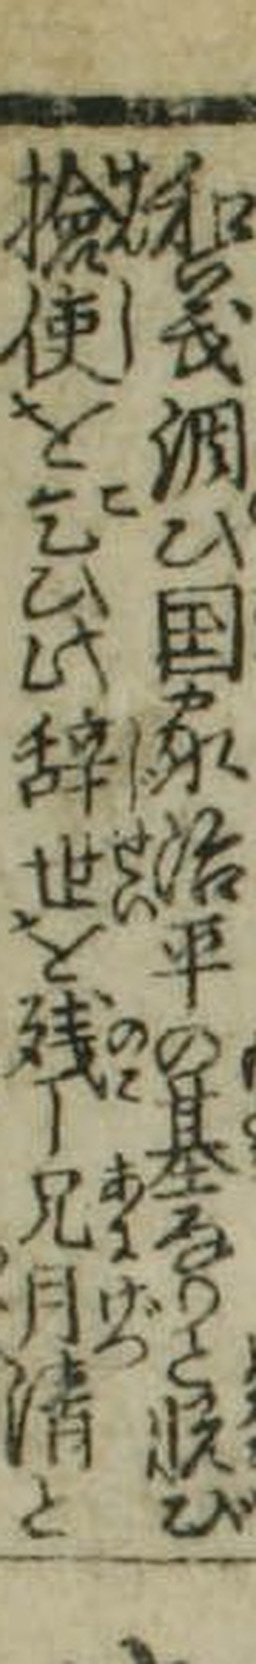検使を乞ひ此辞世を残し兄月清と
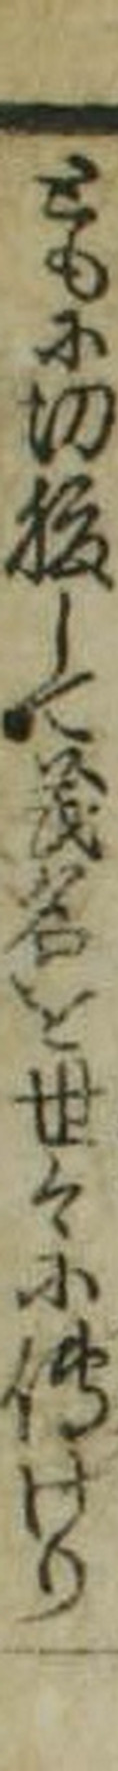ともに切腹して義名を世々に伝けり
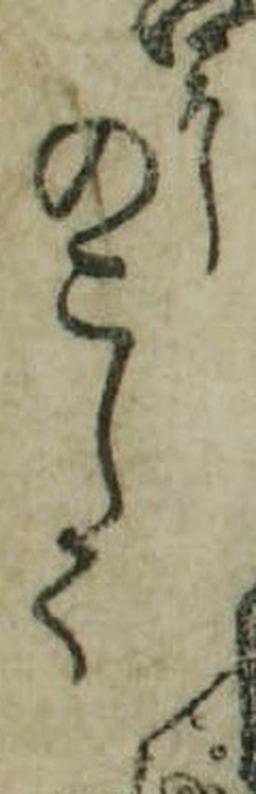のこして

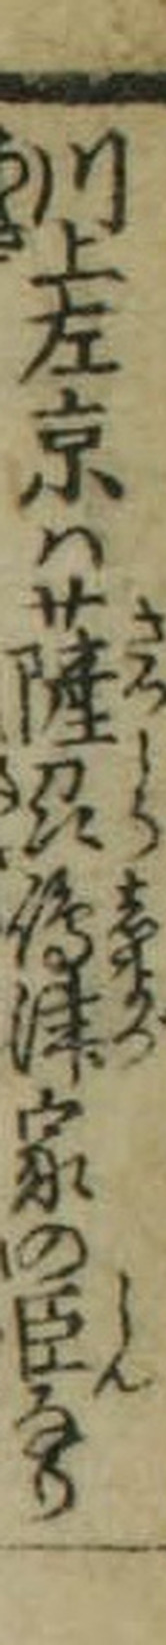川上左京は薩州嶋津家の臣なり
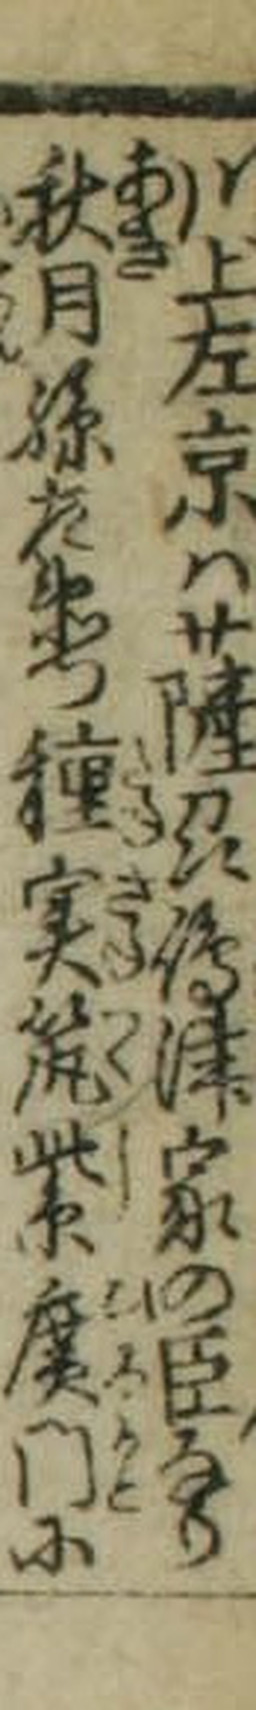秋月孫左衛門種実筑紫広門に
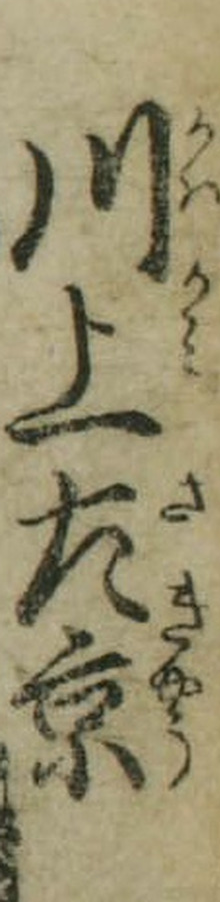川上左京
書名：續英雄百人一首
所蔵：東京学芸大学附属図書館
